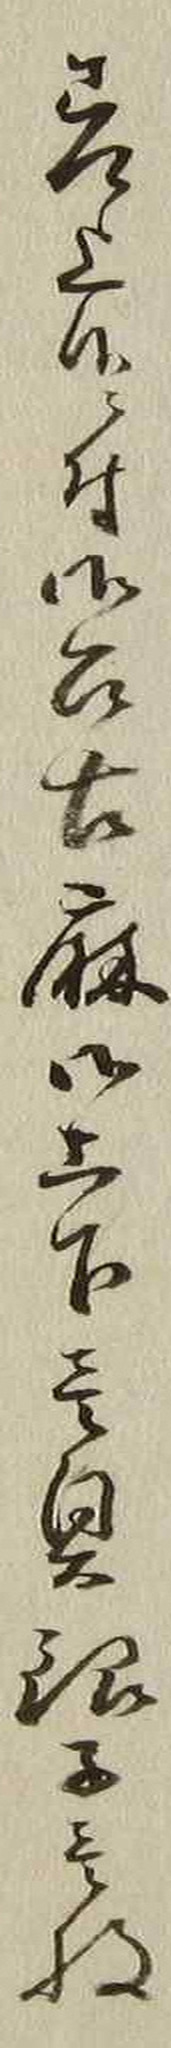差上候ニ付御召古麻御上下壱具銀子壱枚
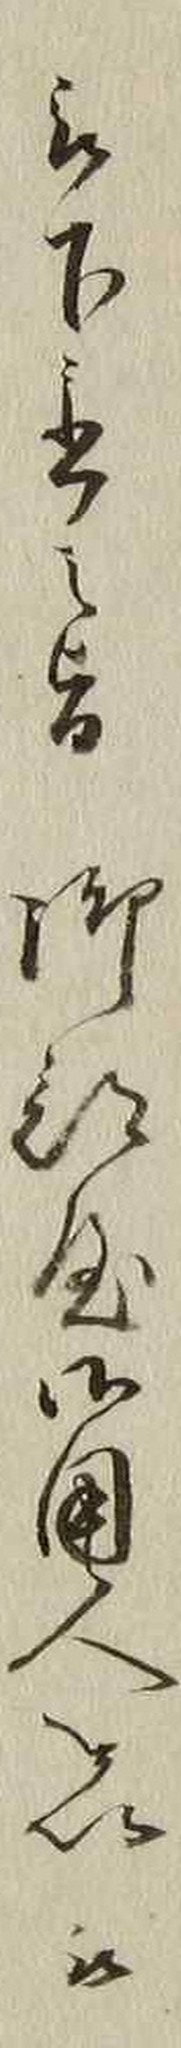被下置之旨御部屋御用人を以被
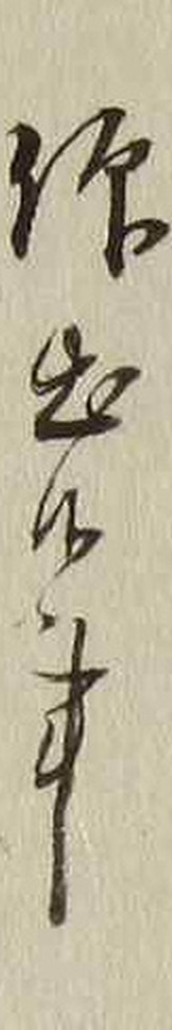仰出候事
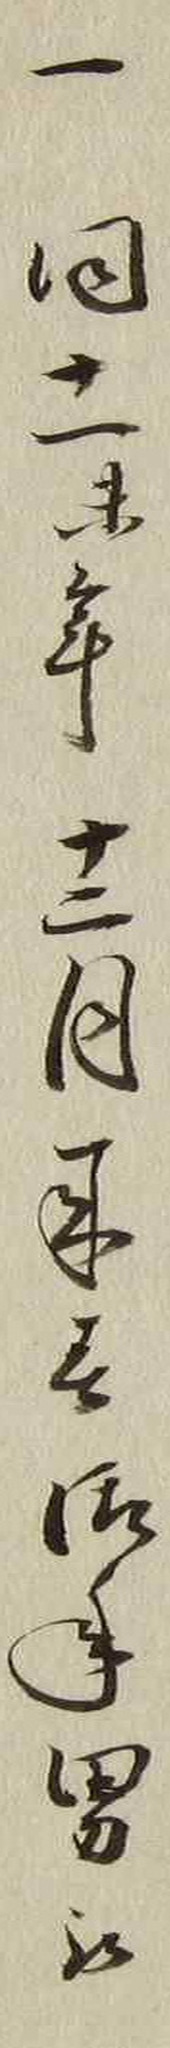一同十一未年十二月来春御年男被
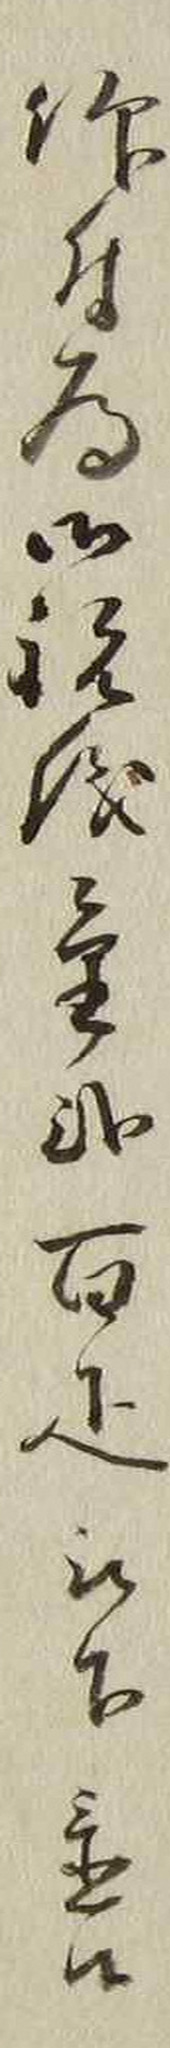仰付為御祝儀金弐百疋被下置候
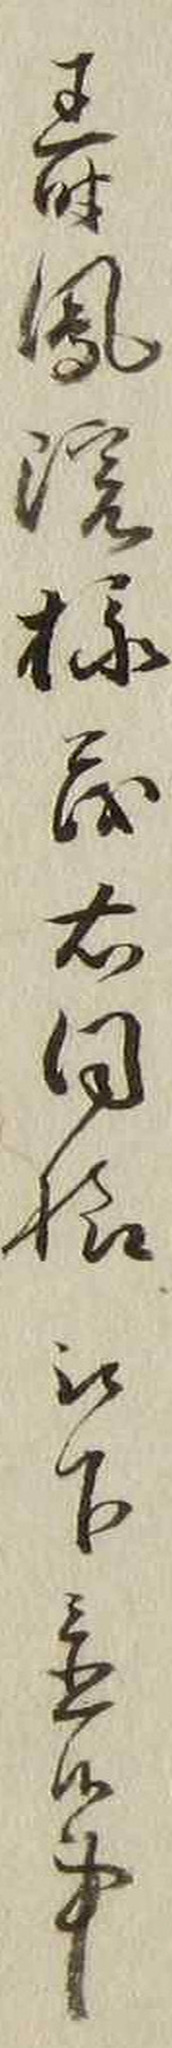寿鳳院様茂右同様被下置候事
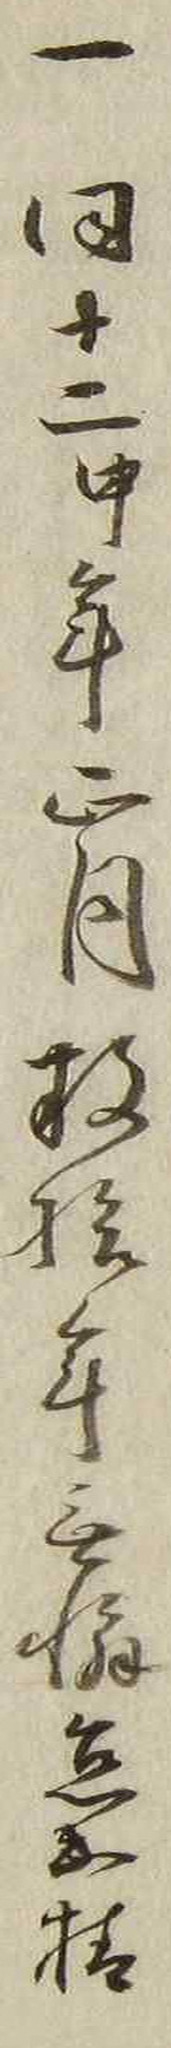一同十二申年正月数拾年無懈怠出精

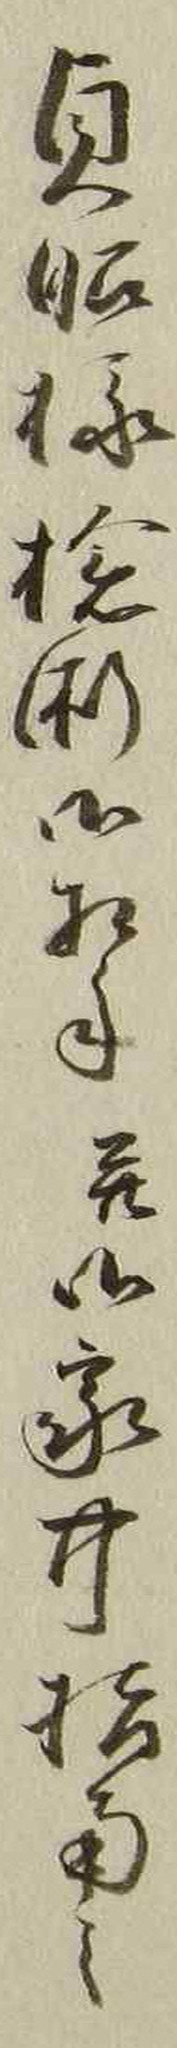貞昭様槍術御相手并御家中指南之
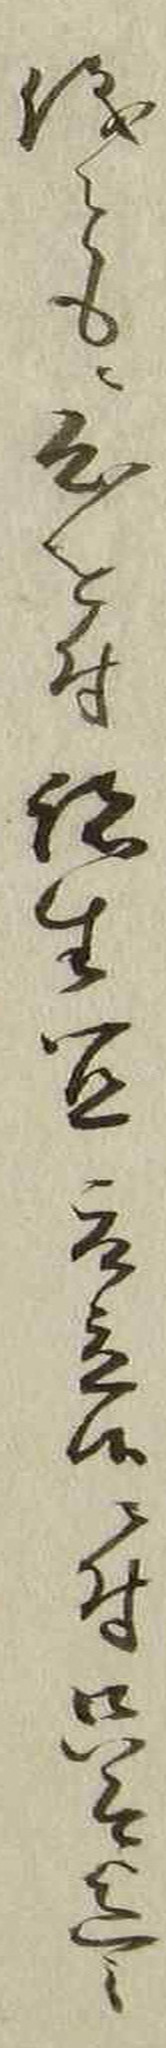儀ともニ心を付諸生宜取立候ニ付只今迄之
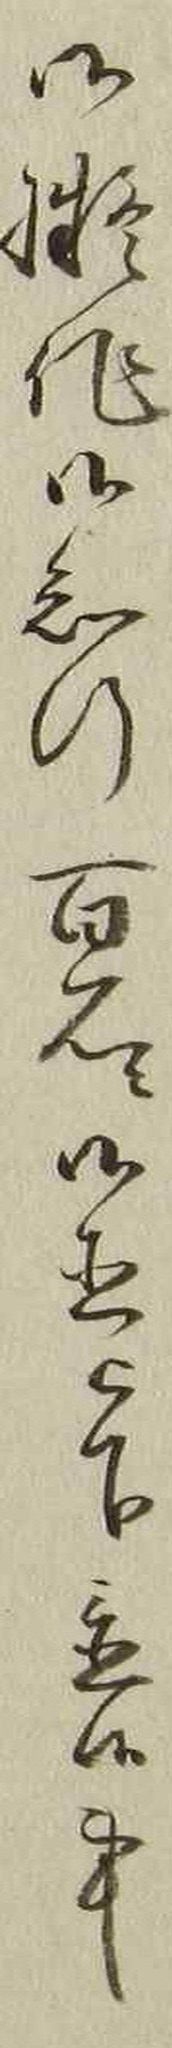御擬作御知行百石ニ御直被下置候事
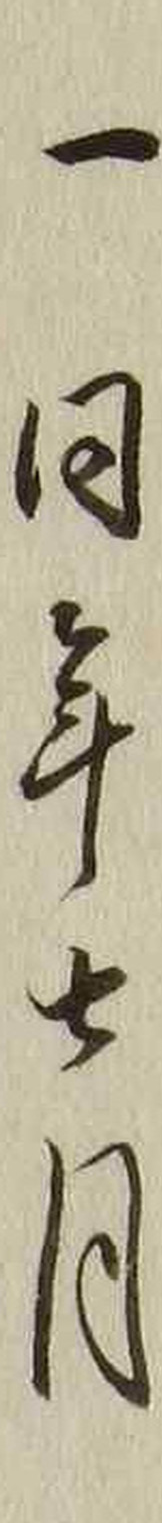一同年七月
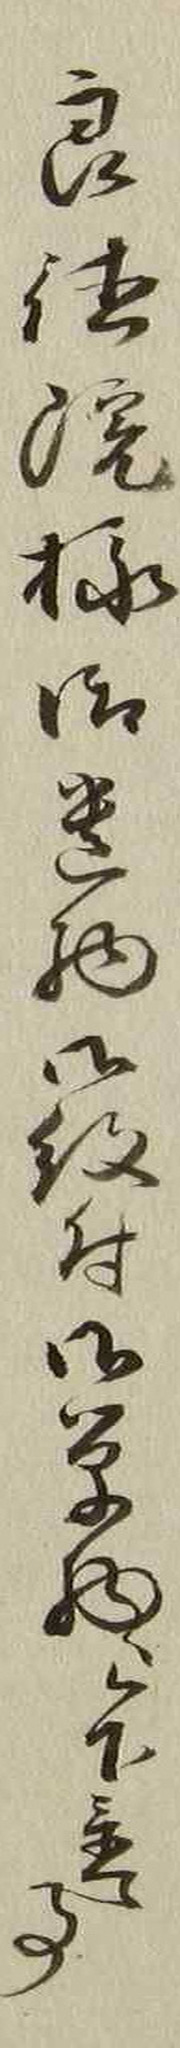良徳院様御遺物御紋付御単物被下置候事
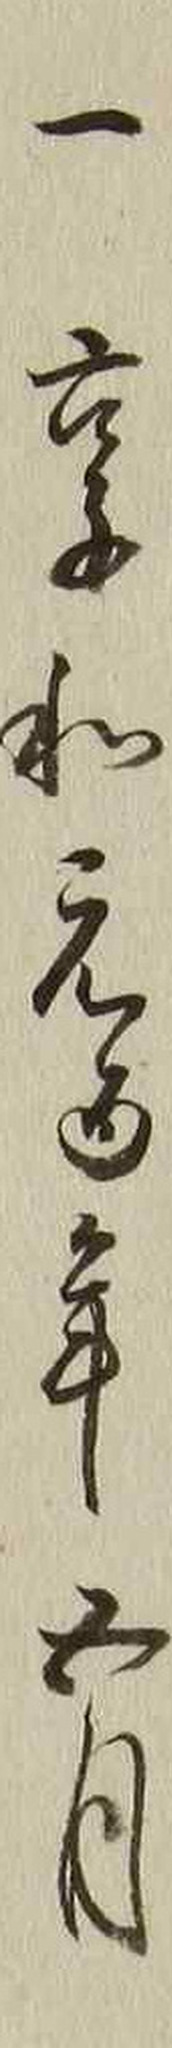一享和元酉年五月
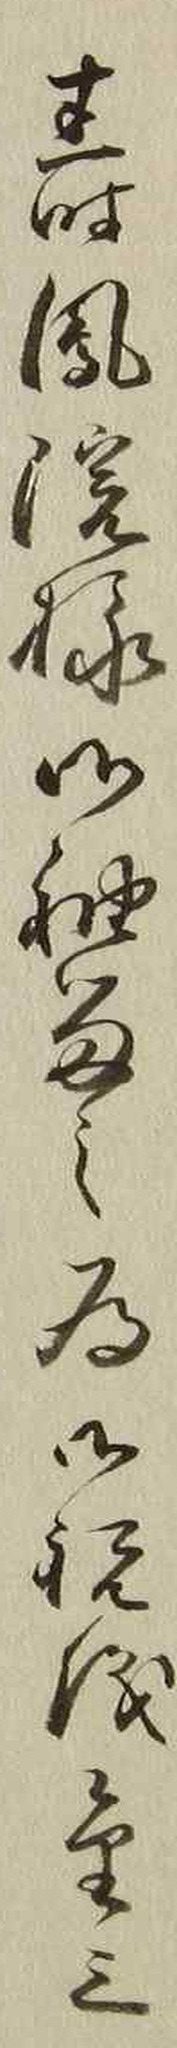寿鳳院様御袖留之為御祝儀金三
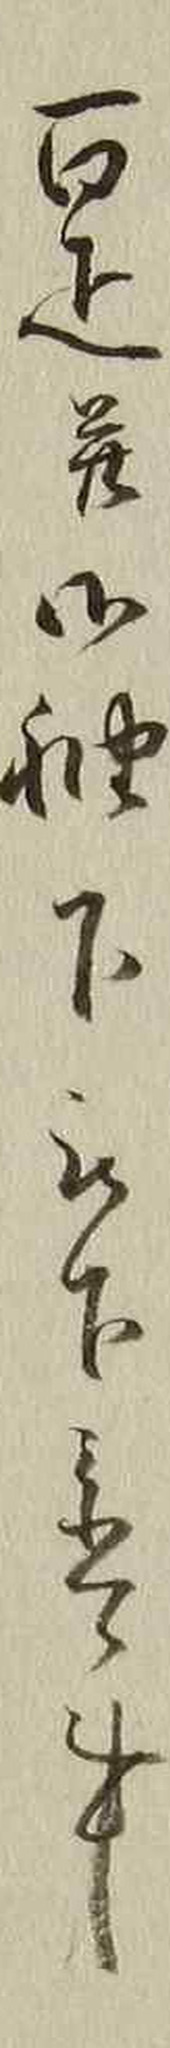百疋并御袖下被下置候事
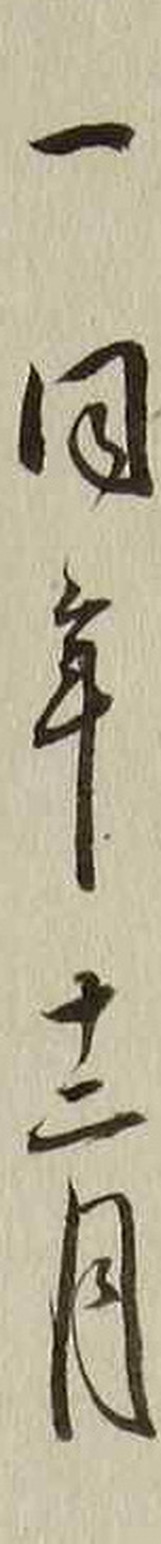一同年十二月
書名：諸士系譜　巻之28　い之部28
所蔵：会津若松市立会津図書館
